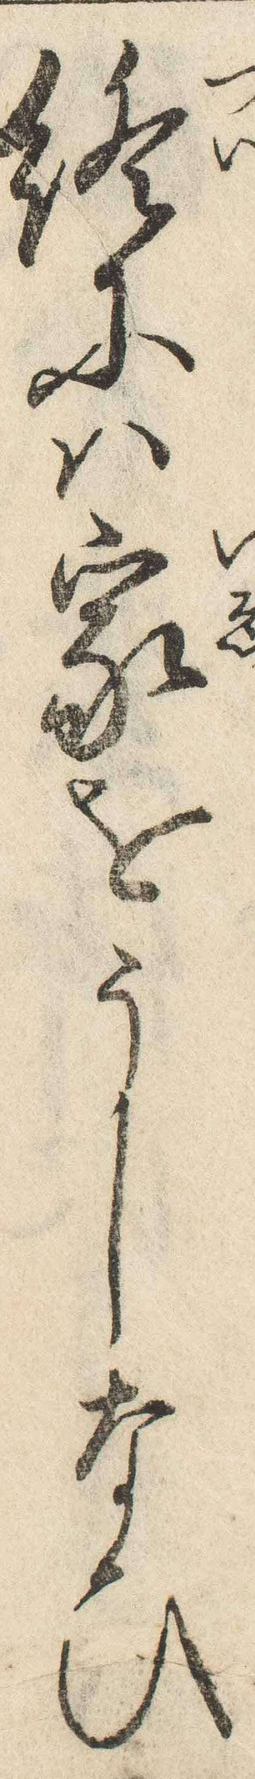終には家をうしなひ
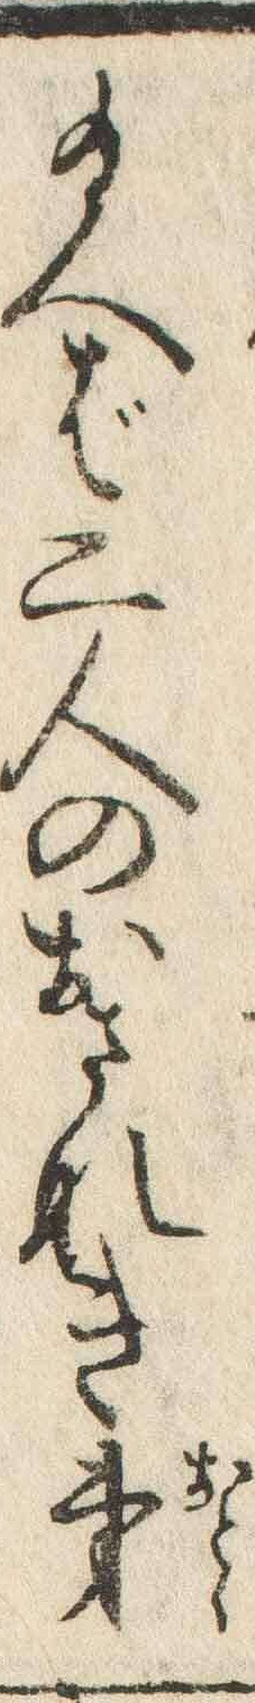給へば二人のおさなき弟
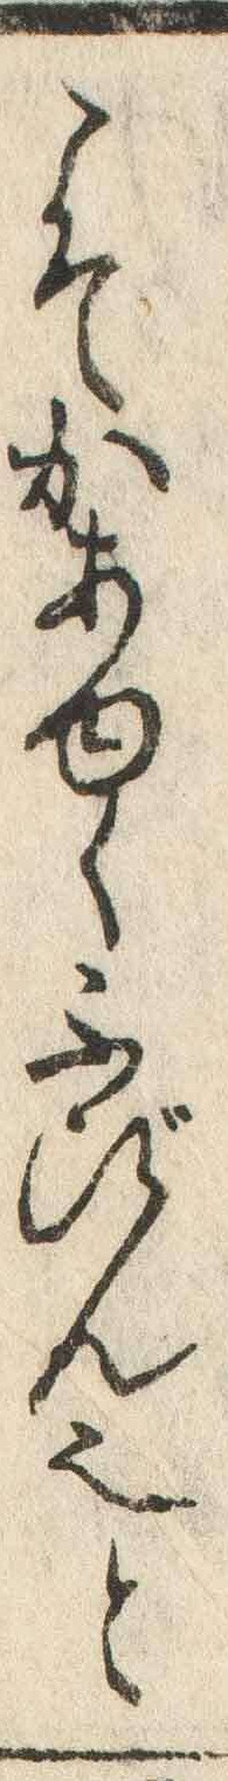こそかあゆくふびん也と
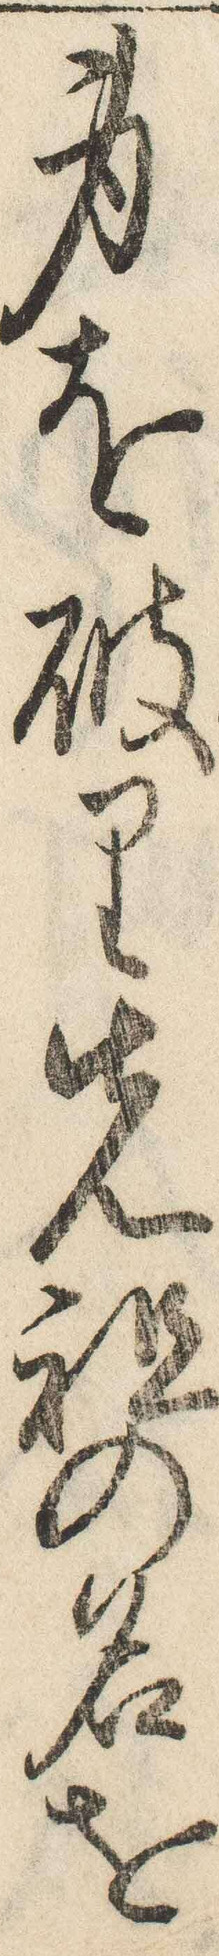身を破り先祖の名を
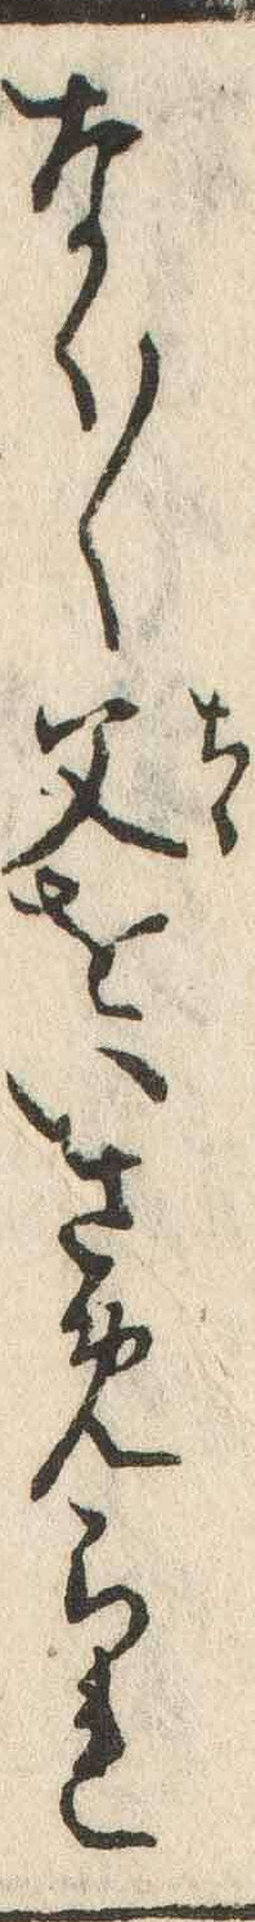なく〳〵父をいさめられ
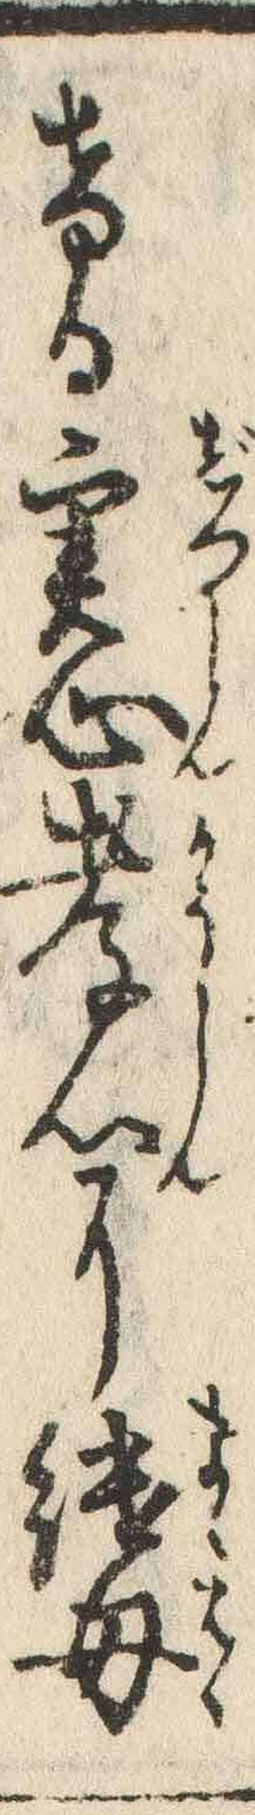ける実心孝心に継母
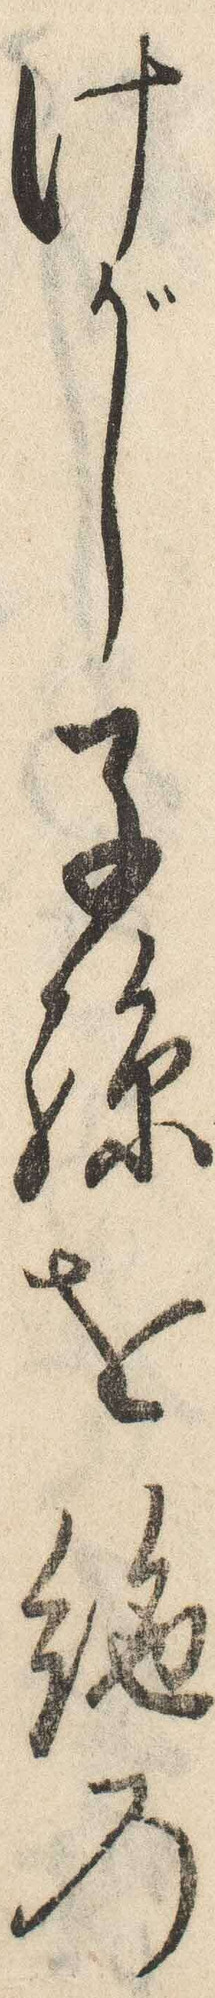けがし子孫を絶の
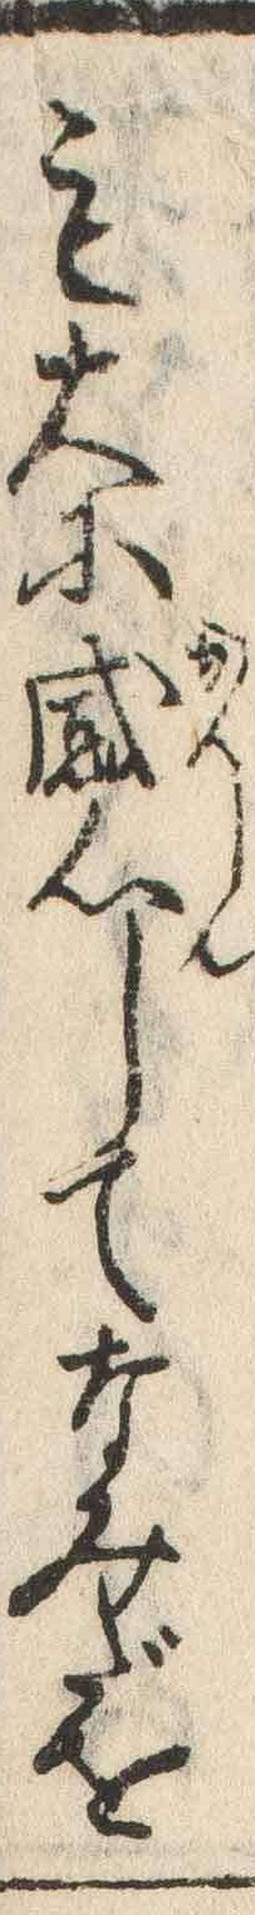も大に感心してなみだを
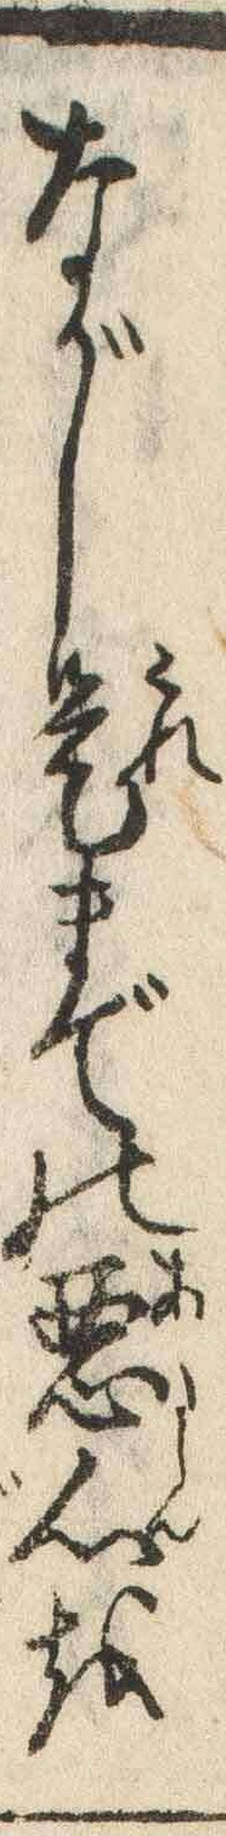ながし是までの悪心を
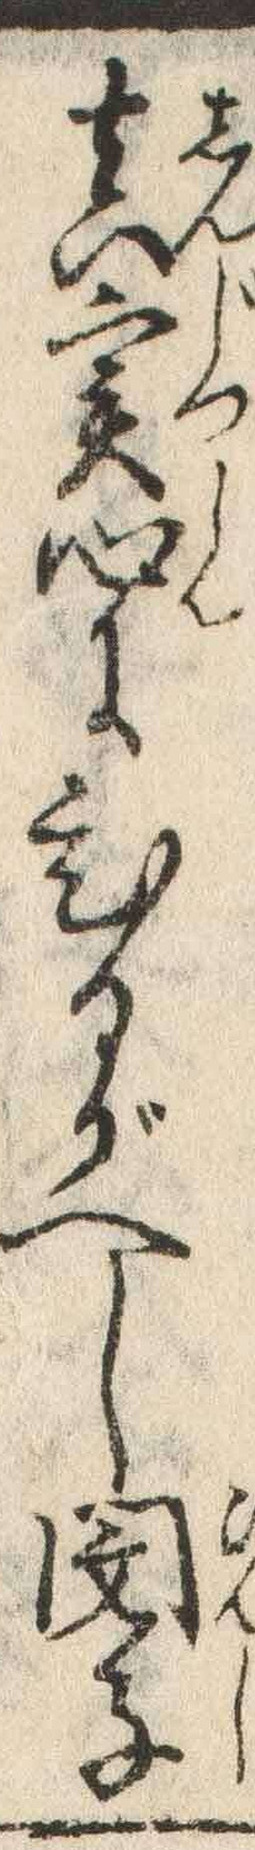真実心にひるがへし閔子
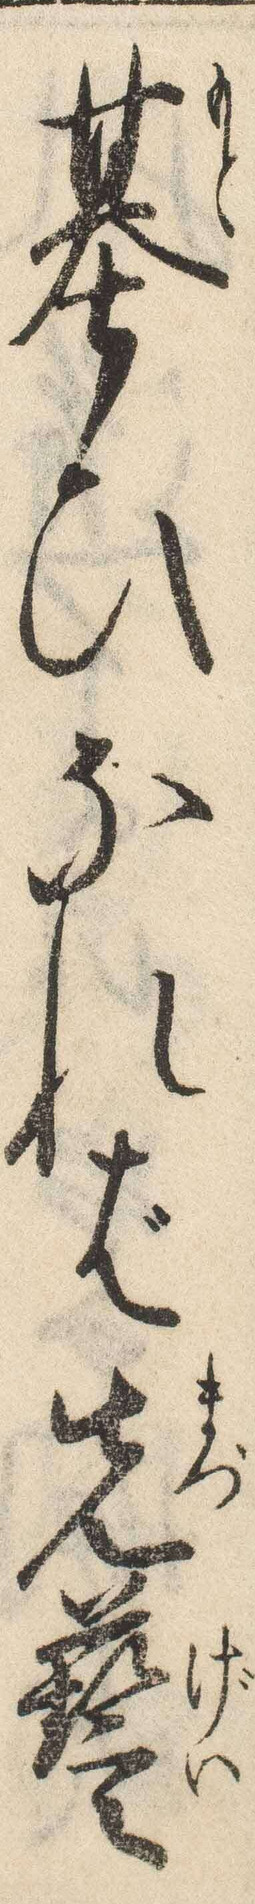基ひなれば先芸
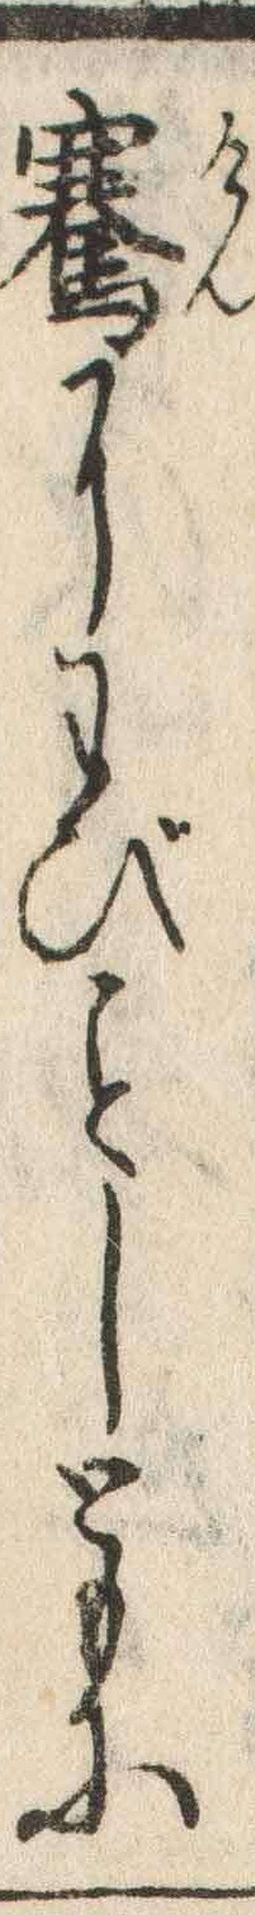騫にわびことしともに
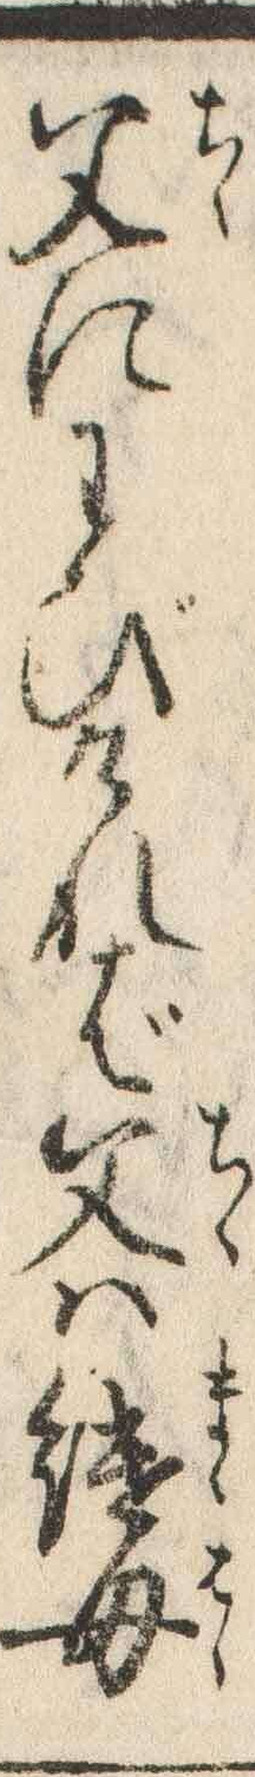父にわびければ父は継母
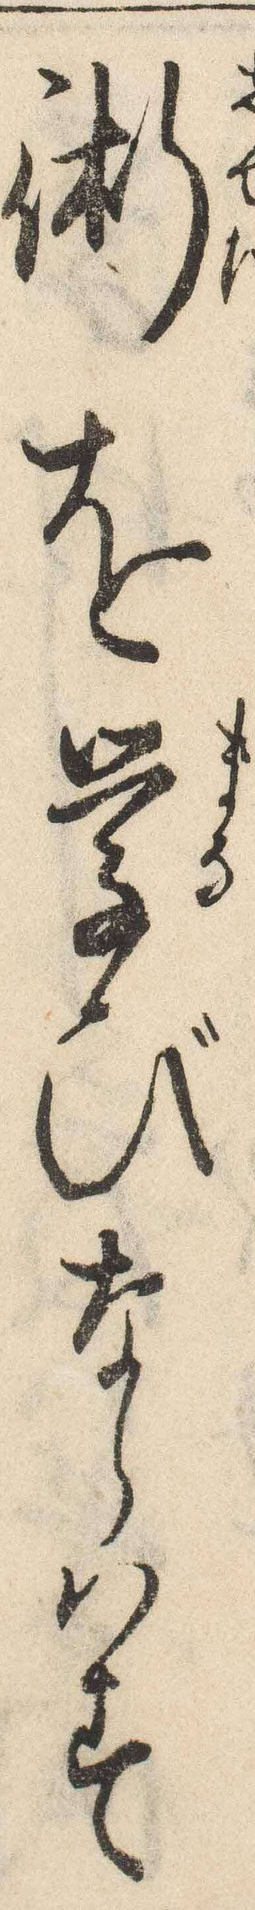術を学びならはす
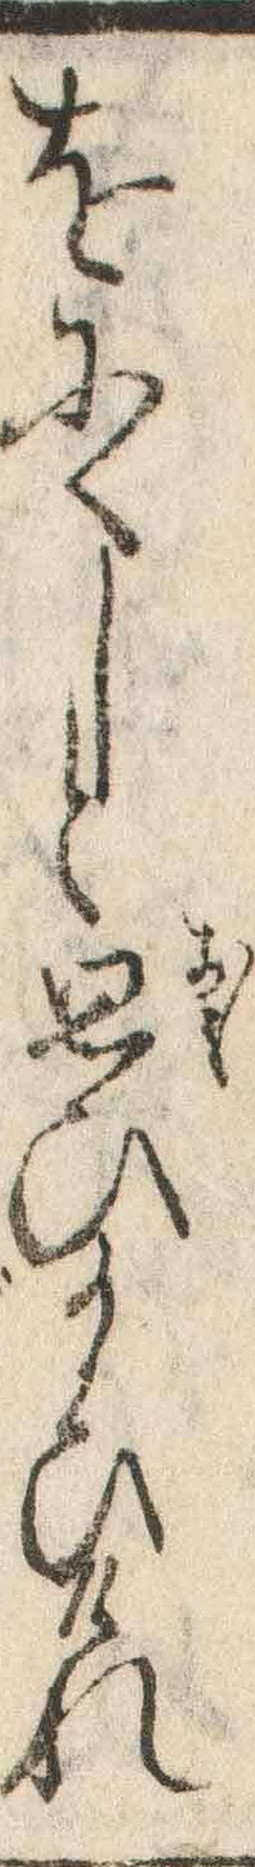をにくしと思ひ給ひけれ
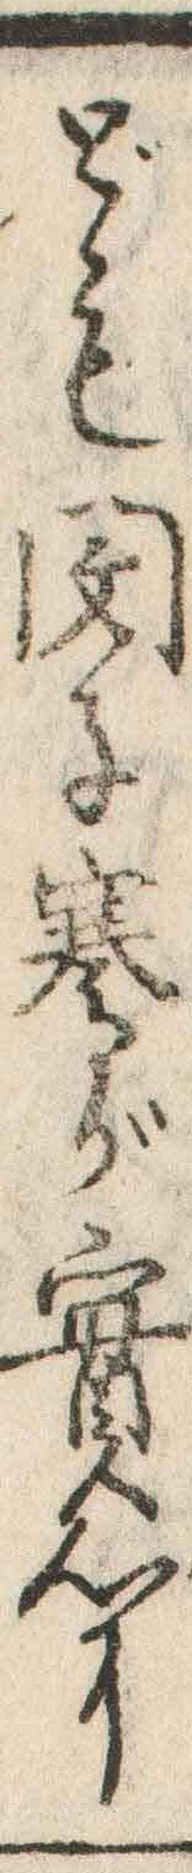ども閔子騫が実心に
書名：撫育草
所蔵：東京学芸大学附属図書館 国文学研究資料館
